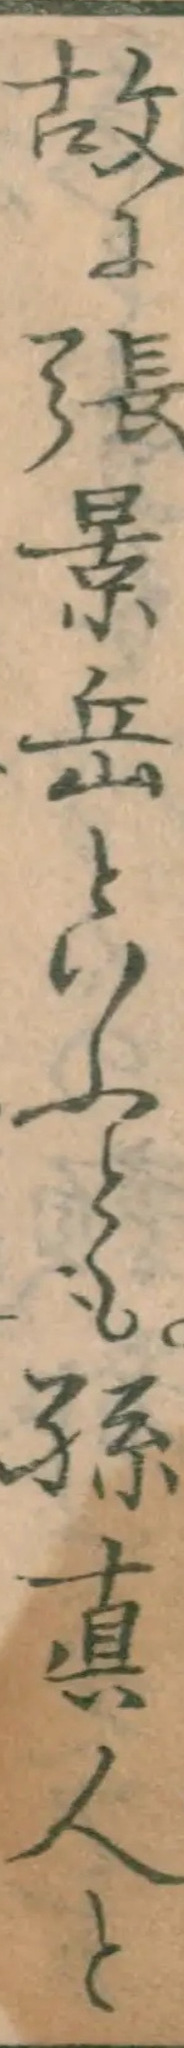故に張景岳といふとも。孫真人と
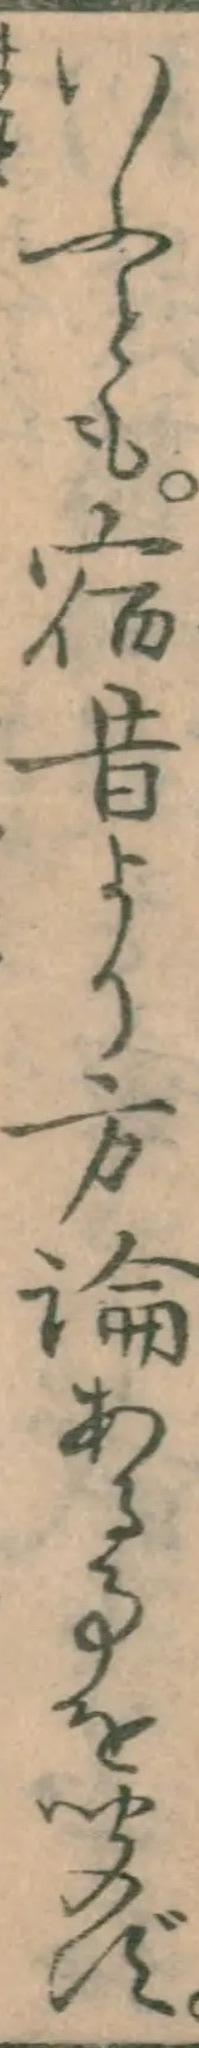いふとも。宿昔より方論ある事を聞ず。
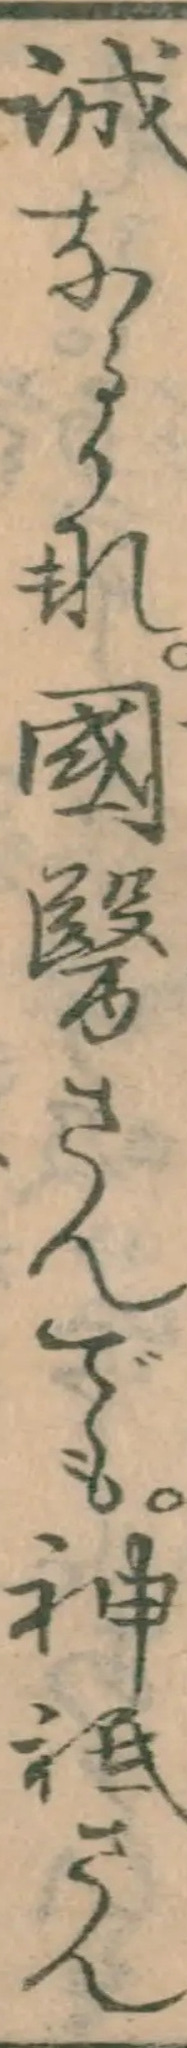誠なるかな。国医さんでも。神祇さん
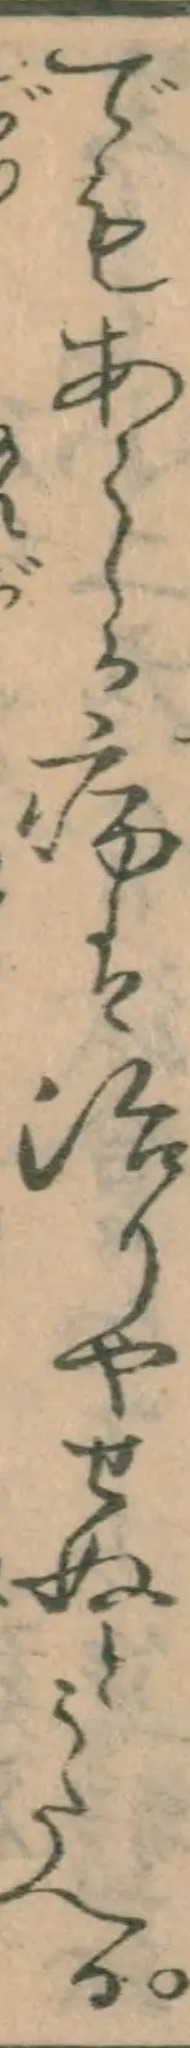でもあしか病は治りやせぬとうたへる。
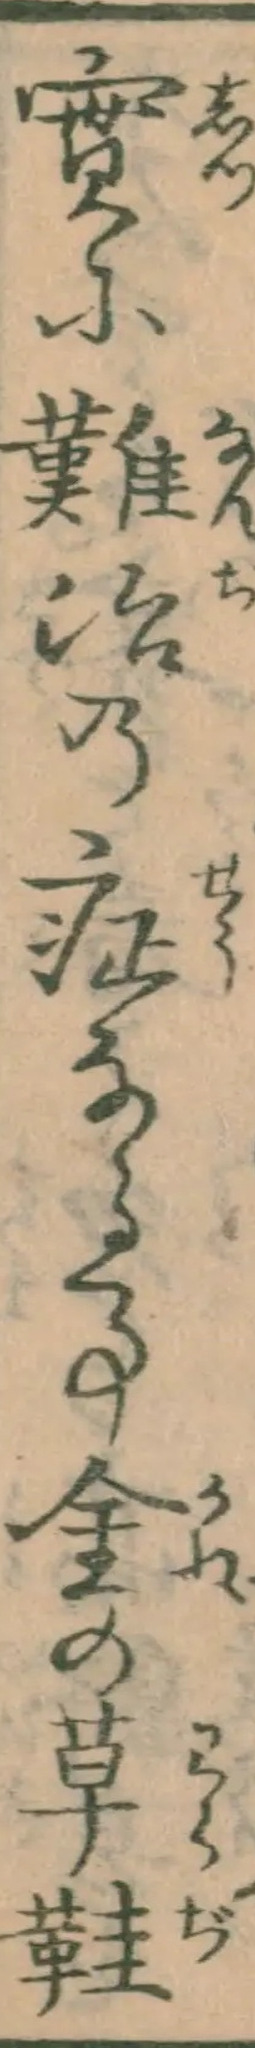実に難治の症なる事金の草鞋
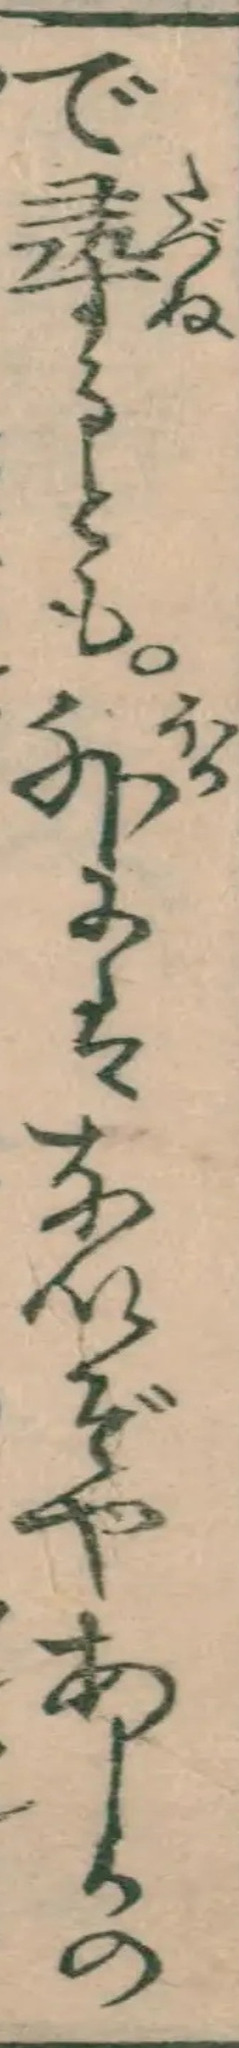で尋るとも。外にはないぞやあしかの
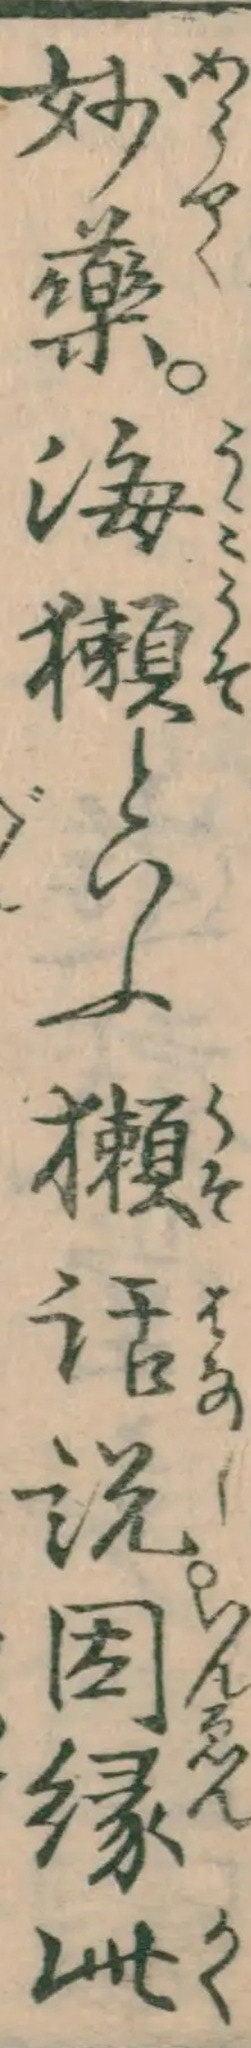妙薬。海獺といふ獺話説。因縁此
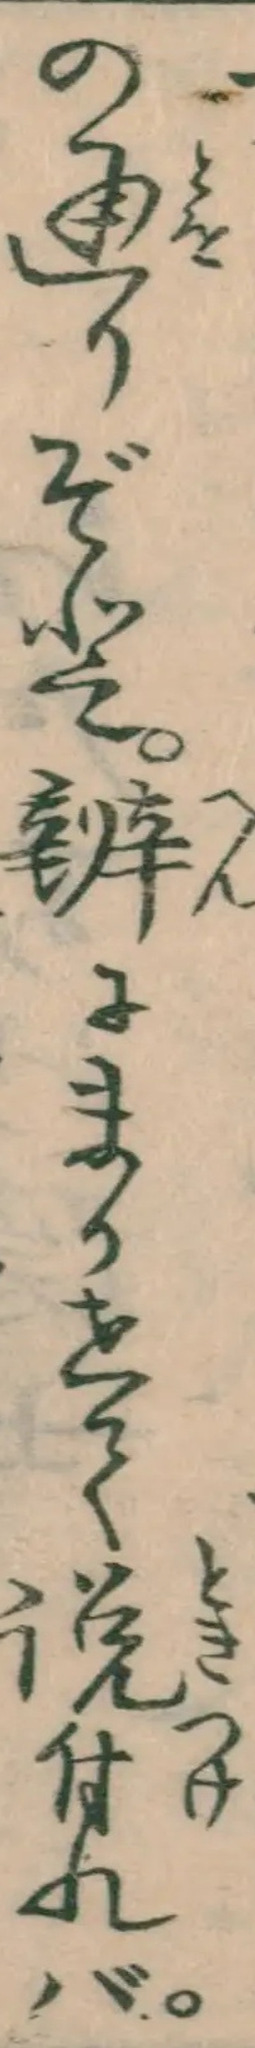の通りぞと。弁にまかせて説付れば。
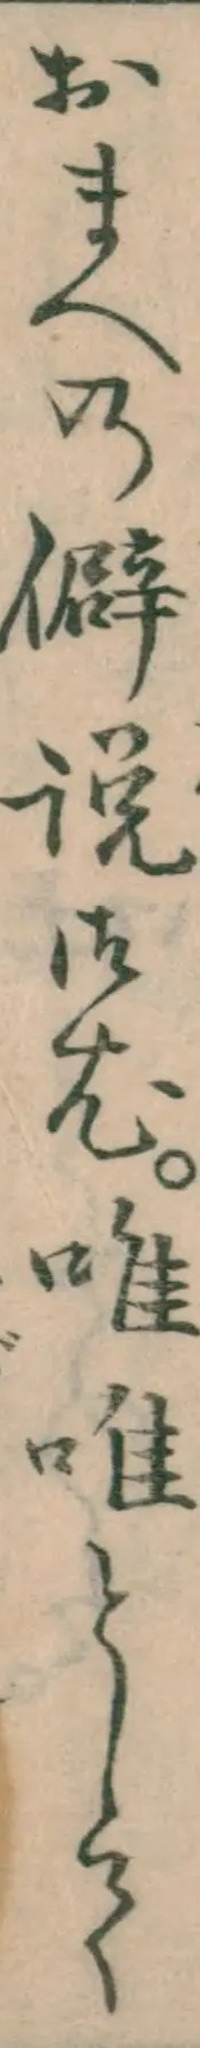おまへの僻説御尤。唯唯として
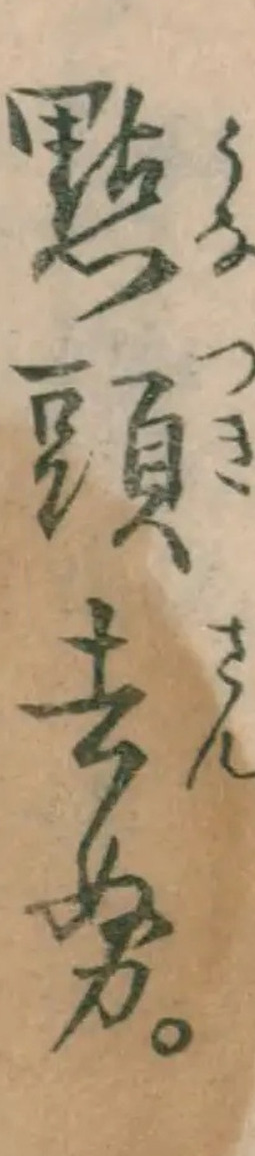点頭去ぬ。
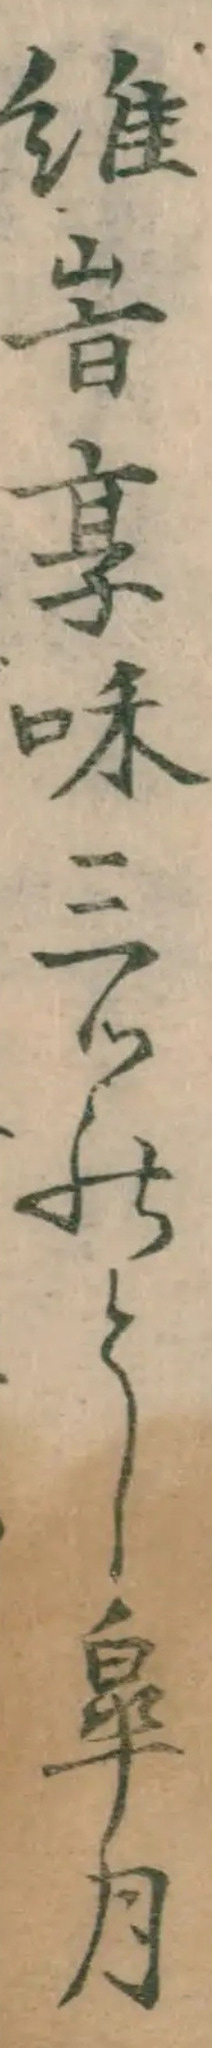維峕享和三ツのとし皐月
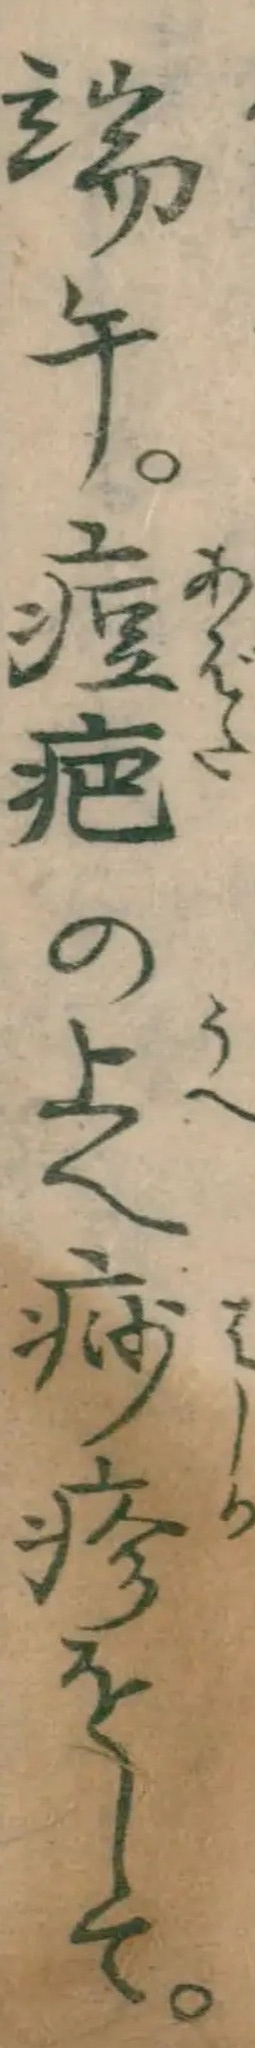端午。痘疤の上へ痧病をして。

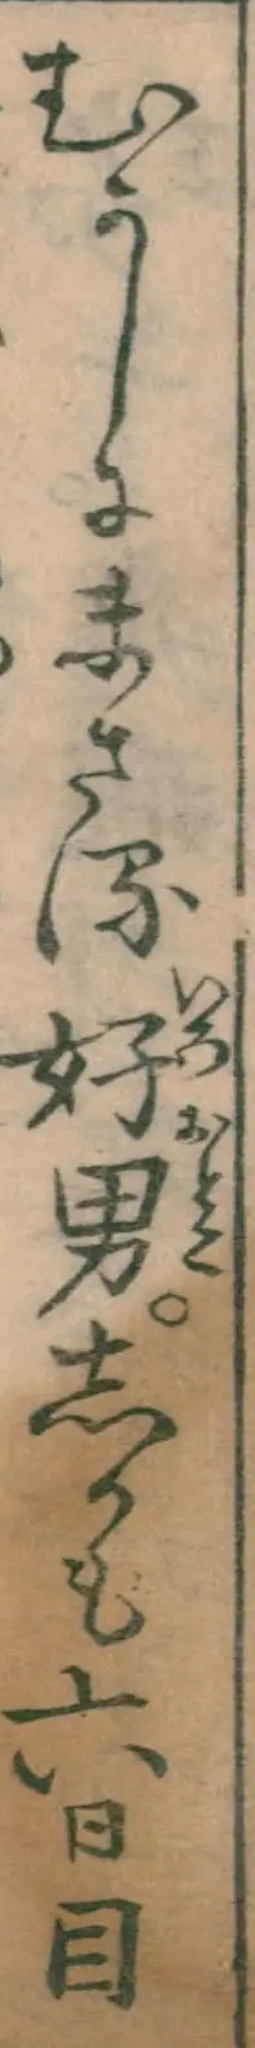むかしにまさる好男。しかも六日目
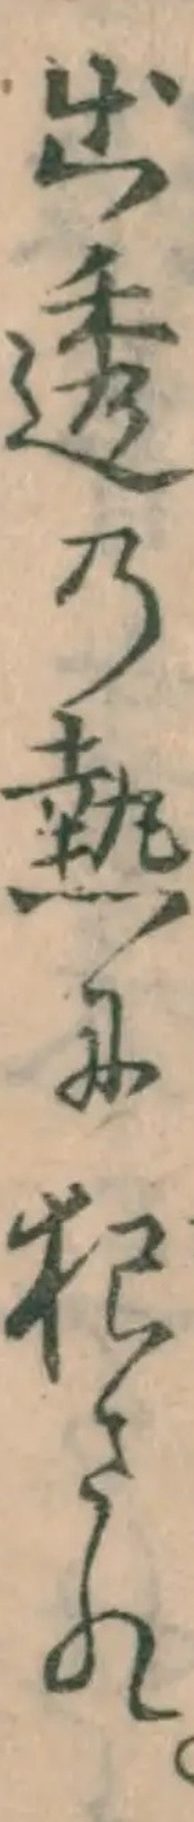出透の熱に犯され。
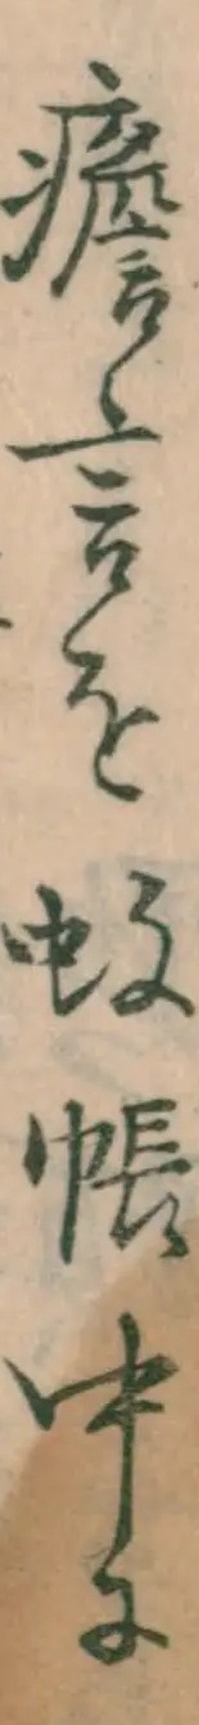癚語を蚊帳中に
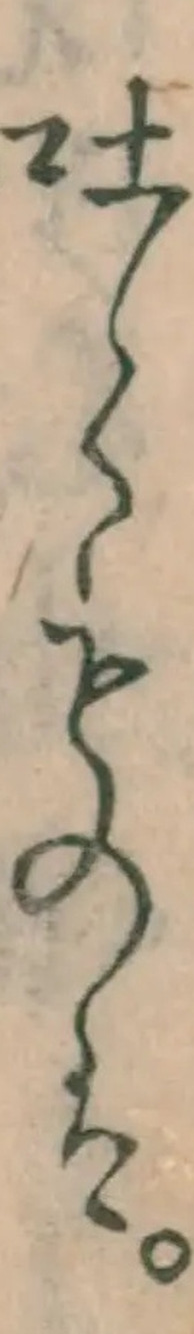吐くものは。
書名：麻疹戯言
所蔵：国立国会図書館 National Diet Library, JAPAN
